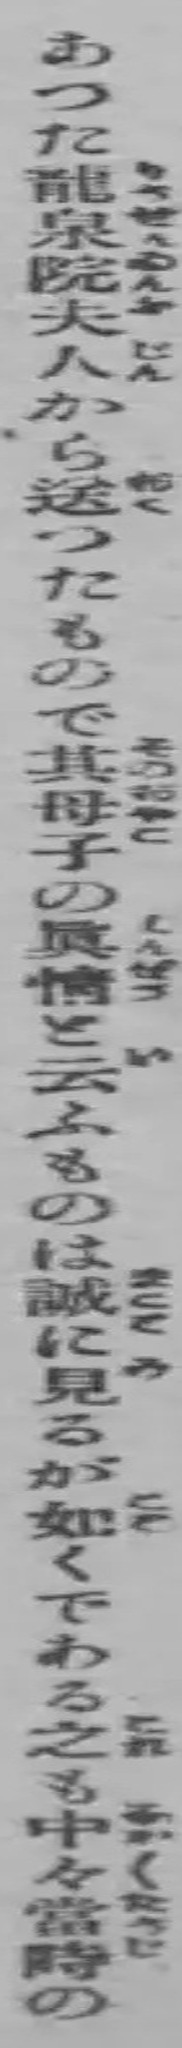あつた龍泉院夫人から送つたもので其母子の真情と云ふものは誠に見るが如くである之も中々当時の
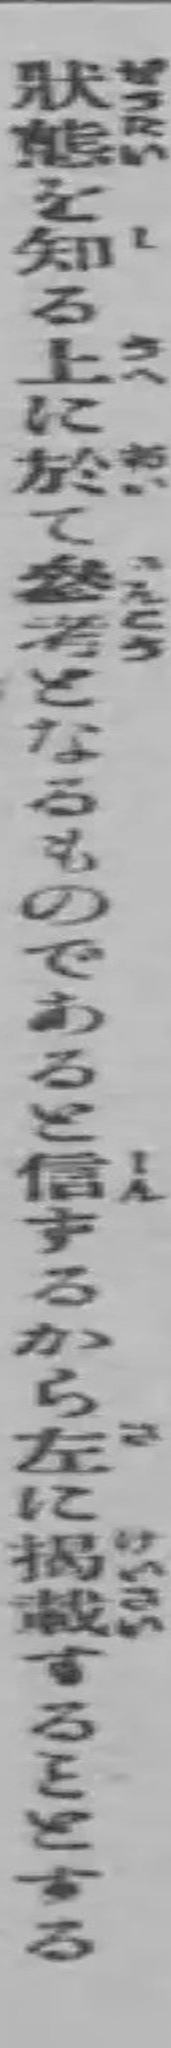状態を知る上に於て参考となるものであると信ずるから左に掲載することとする
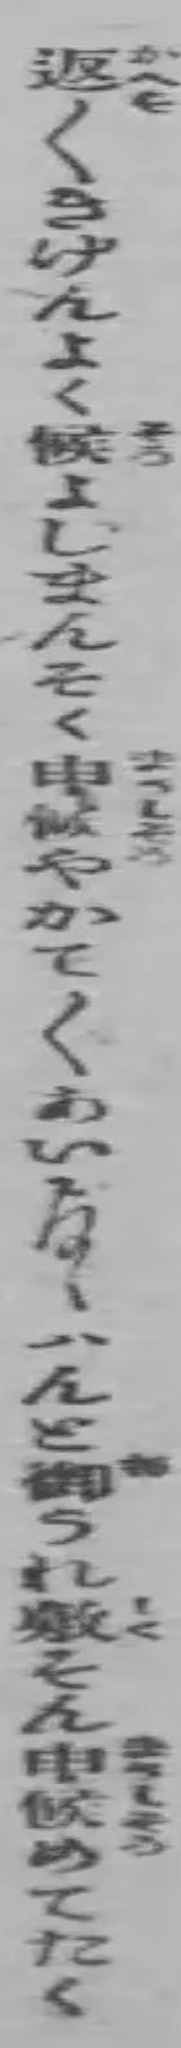返〳〵きげんよく候よしまんそく申候やかて〳〵あいまいらせ候はんと御うれ敷そん申候めてたく
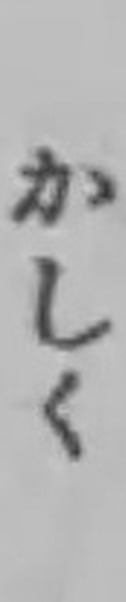かしく
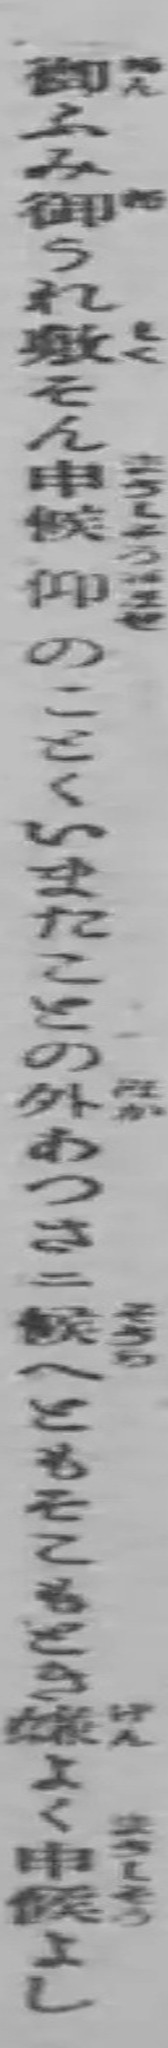御ふみ御うれ敷そん申候仰のことくいまたことの外あつさニ候へともそこもとき嫌よく申候よし
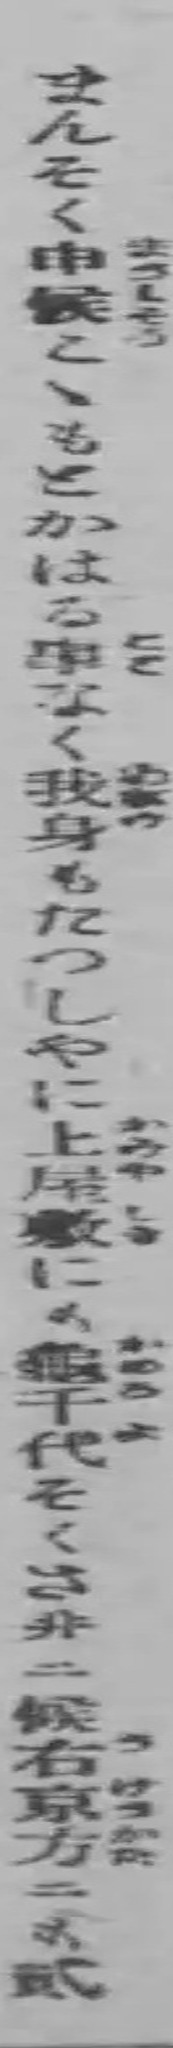まんそく申候こゝもとかはる事なく我身もたつしやに上屋敷にも亀千代そくさ井ニ候右京方ニも弐
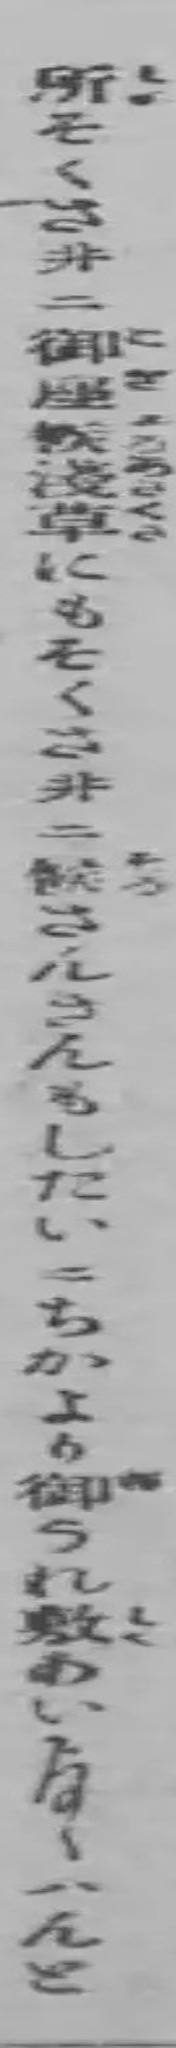所そくさ井ニ御座候浅草にもそくさ井ニ候さんきんもしたいニちかより御うれ敷あいまいらせ候はんと
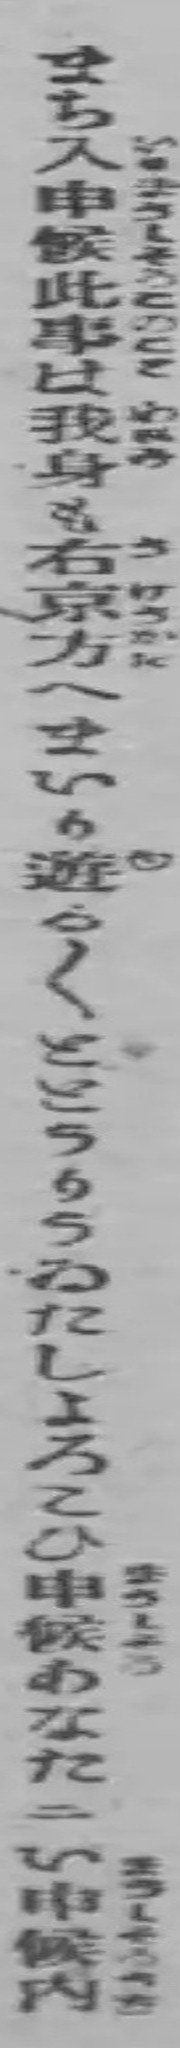まち入申候此事は我身も右京方へまいり遊る〳〵ととうりうゐたしよろこひ申候あなたニい申候内
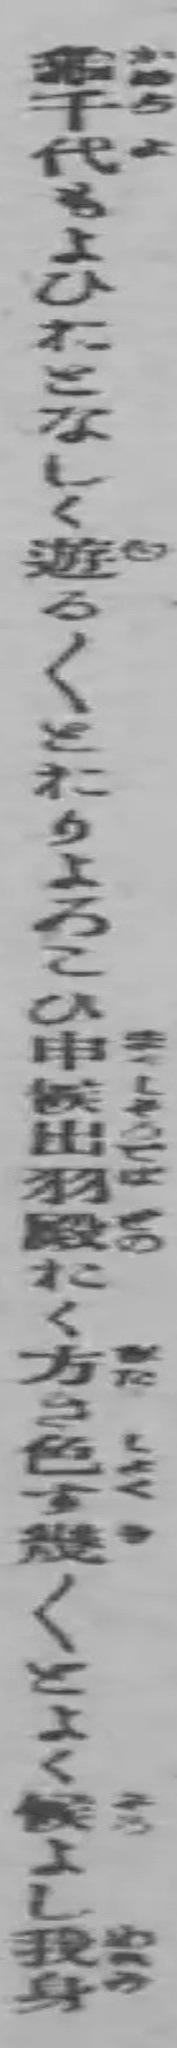亀千代もよひおとなしく遊る〳〵とおりよろこひ申候出羽殿おく方き色す幾〳〵とよく候よし我身
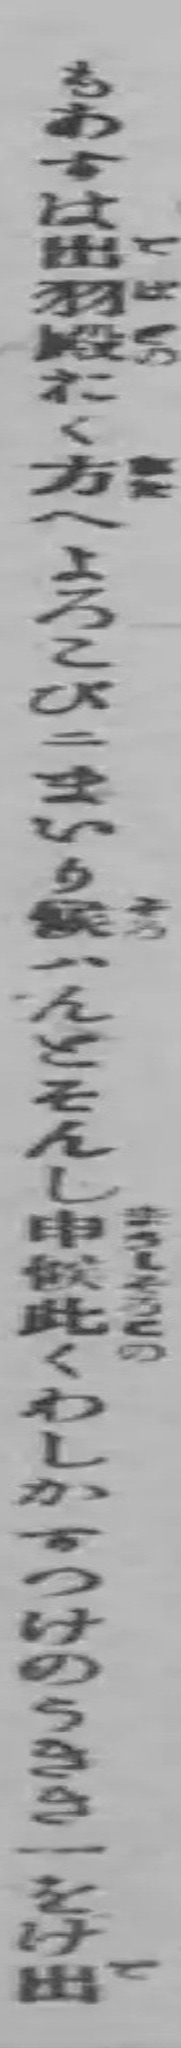もあすは出羽殿おく方へよろこびニまいり候はんとそんし申候此くわしかすつけのうきき一をけ出
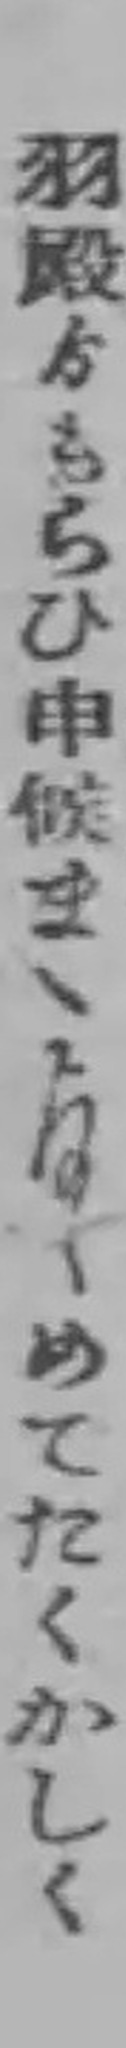羽殿ゟもらひ申候まゝまいらせ候めてたくかしく

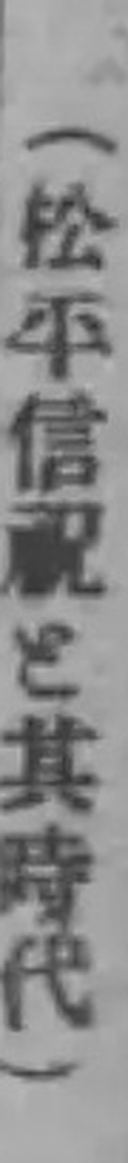●松平信祝と其時代
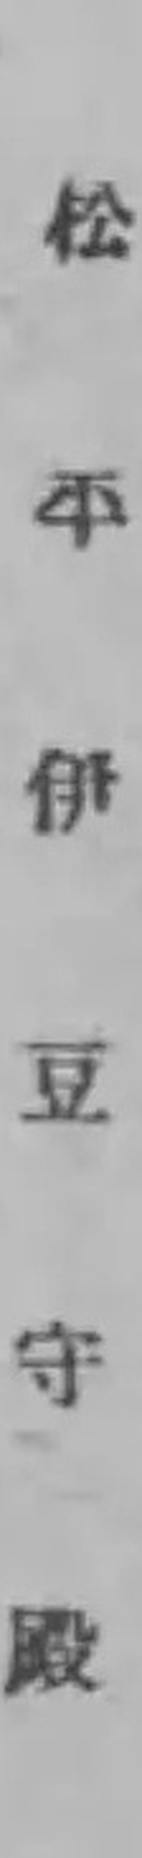松平伊豆守殿
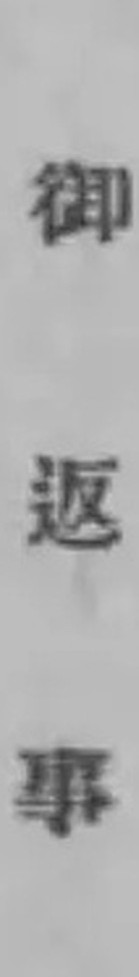御返事
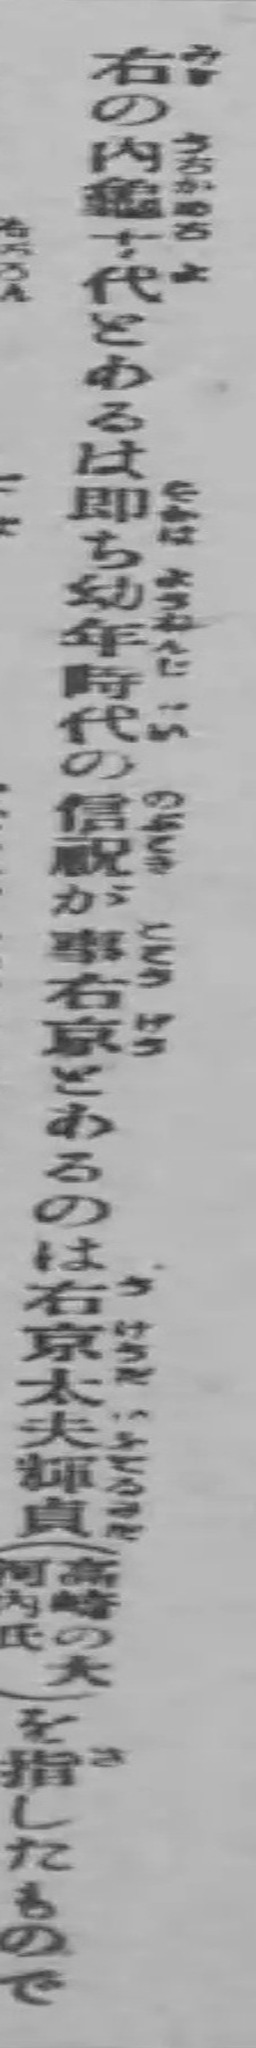右の内亀千代とあるは即ち幼年時代の信祝が事右京とあるのは右京太夫輝貞(高時の大河内氏)を指したもので
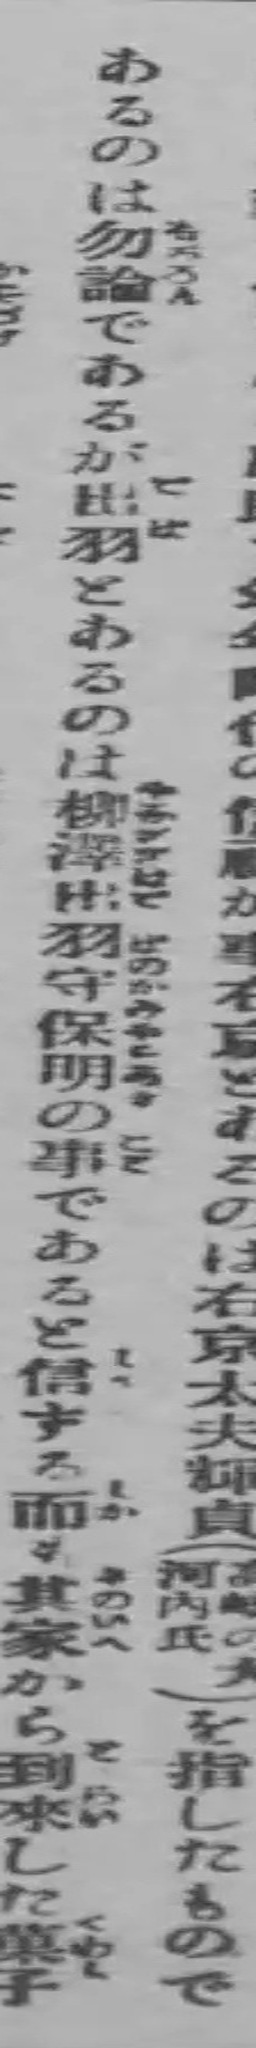あるのは勿論であるが出羽とあるのは柳澤出羽守保明の事であると信ずる而も其家から到来した菓子
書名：豊橋市史談
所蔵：国立国会図書館 National Diet Library, JAPAN
